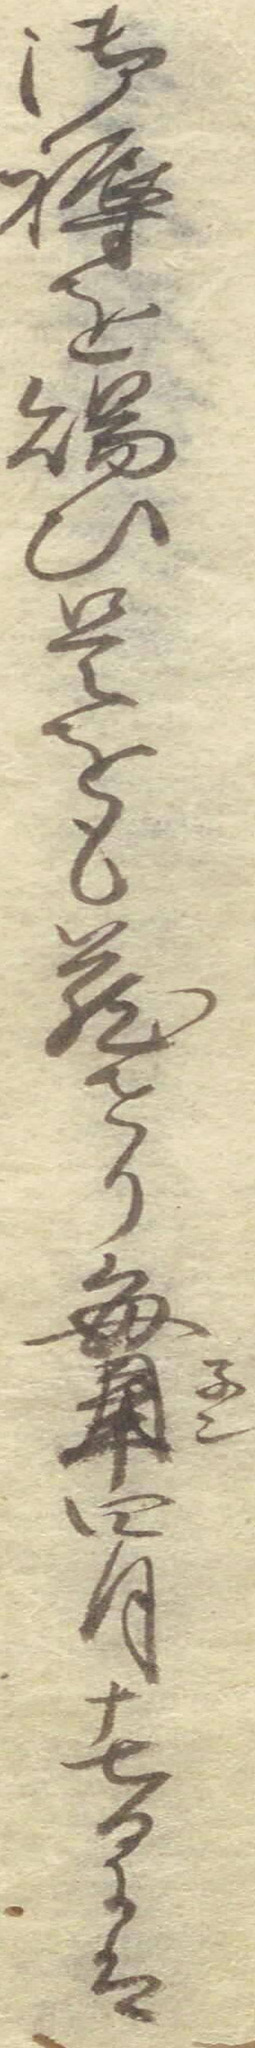御褥を賜ひ是をも蔵せり毎年四月十七日には
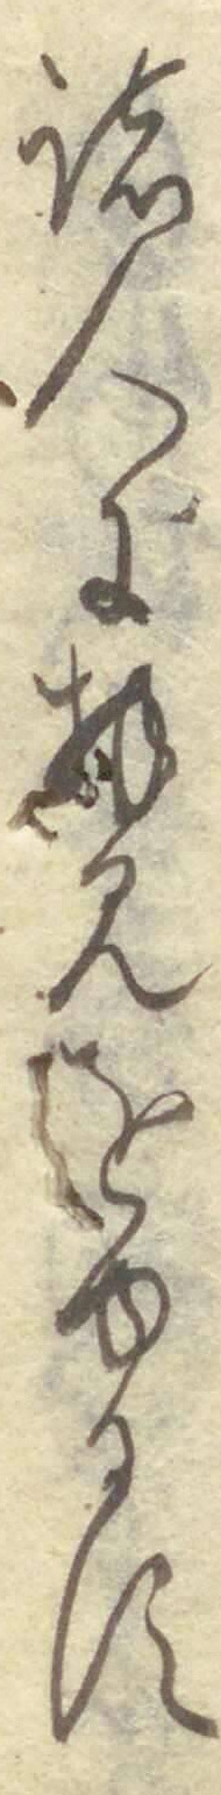諸人に拝見をゆるす
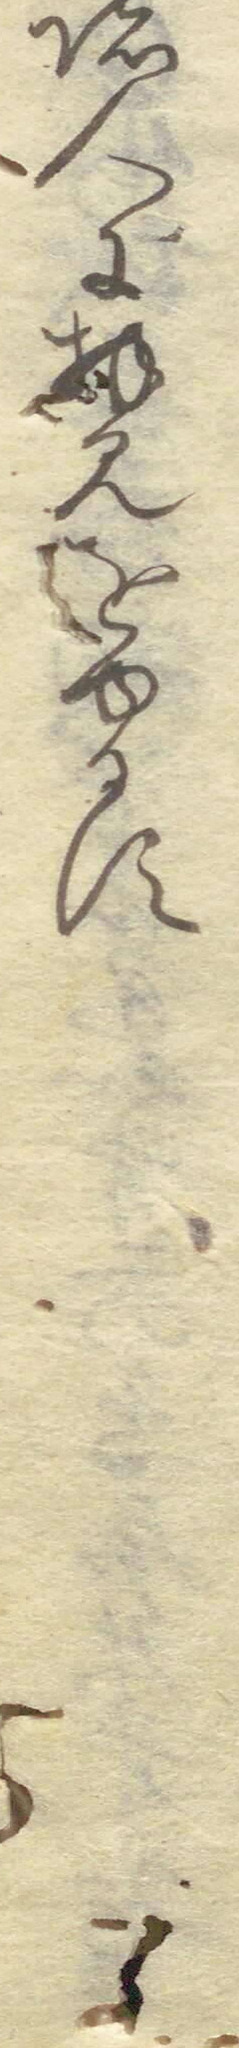諸人に拝見をゆるす
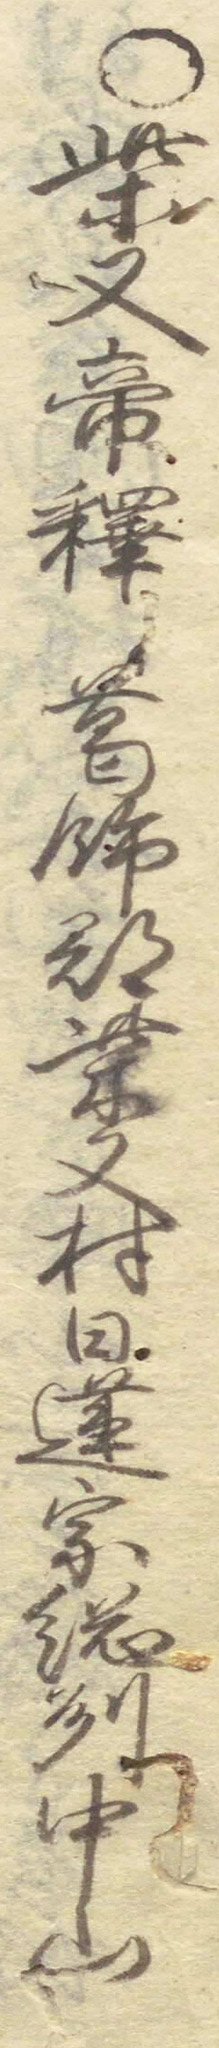○柴又帝釈葛飾郡柴又村日蓮宗総州中山
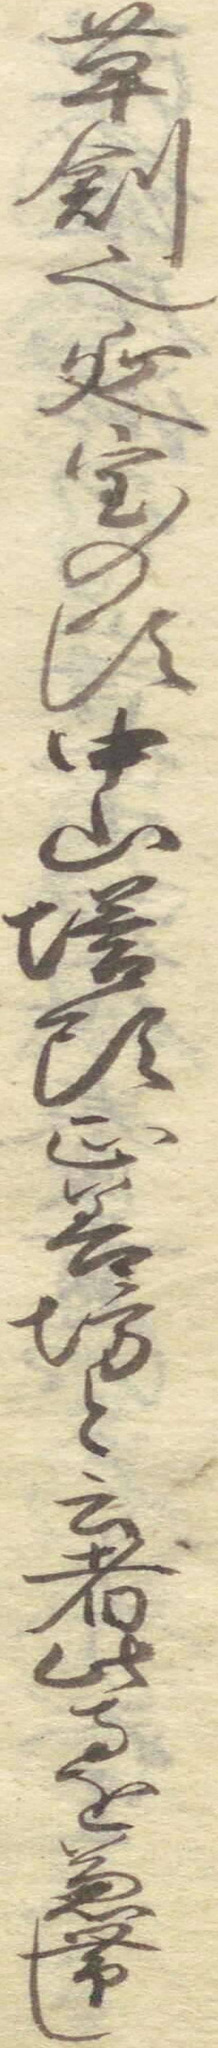草創也延宝の頃中山塔頭正善坊と云者此寺を兼帯し
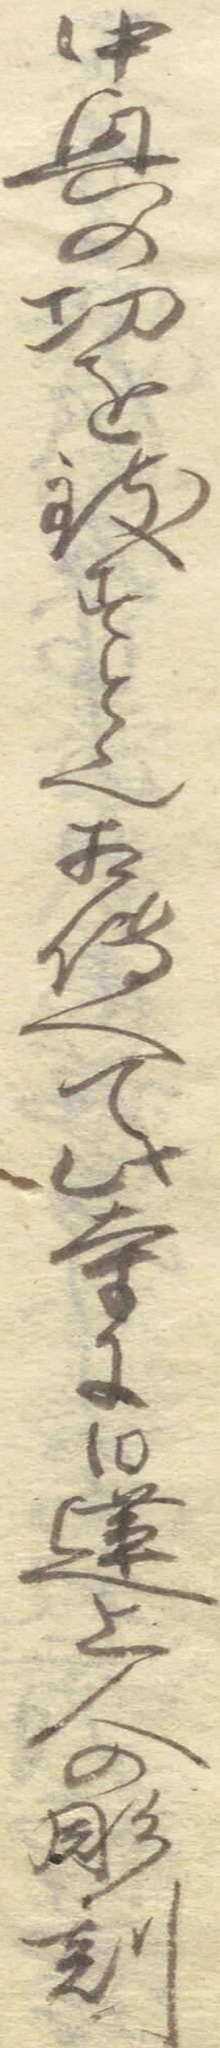中興の功を致すと也相伝へて此気に日蓮上人の彫刻
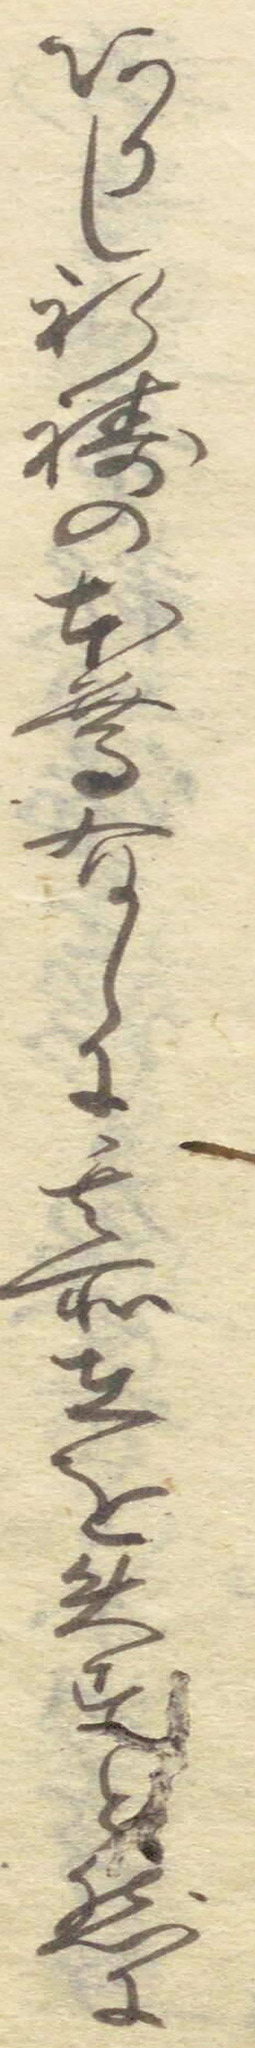ありし祈祷の本尊有しに其所在を失すと然に
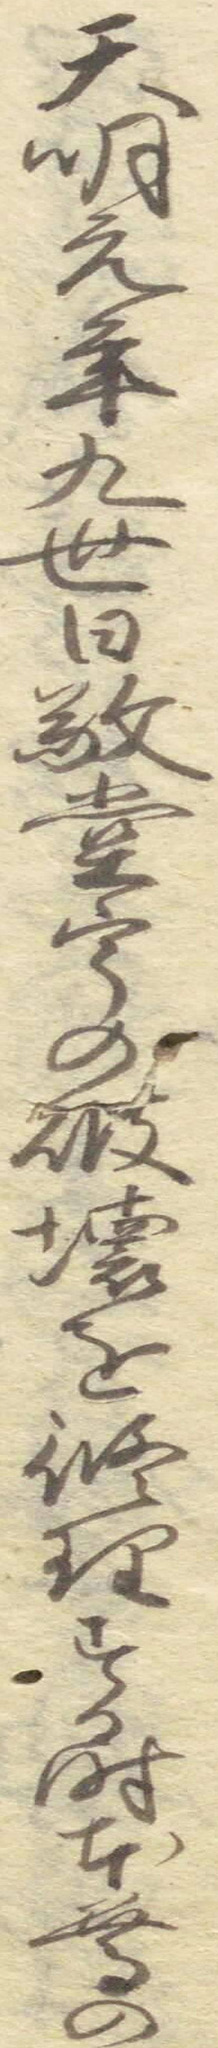天明元年九世日敬堂宇の破壊を修理する時本尊の
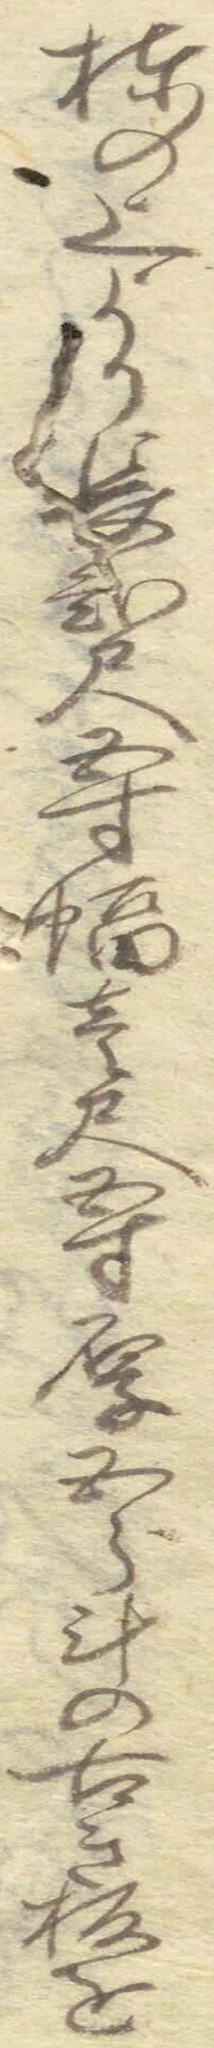棟の上より長弐尺五寸幅壱尺五寸厚五分斗の古き板を
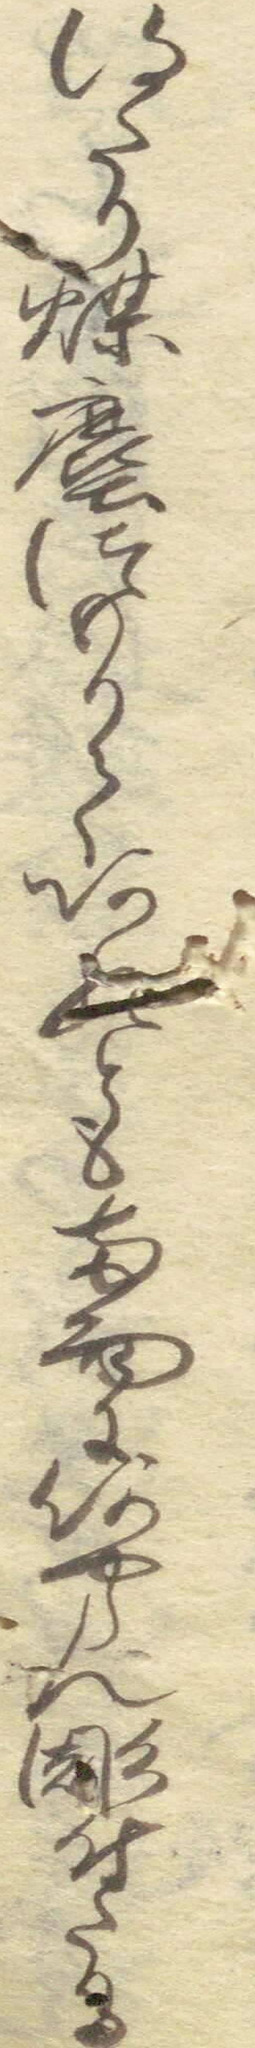得たり煤塵つもりてあれとも両面に何やらん彫付たる
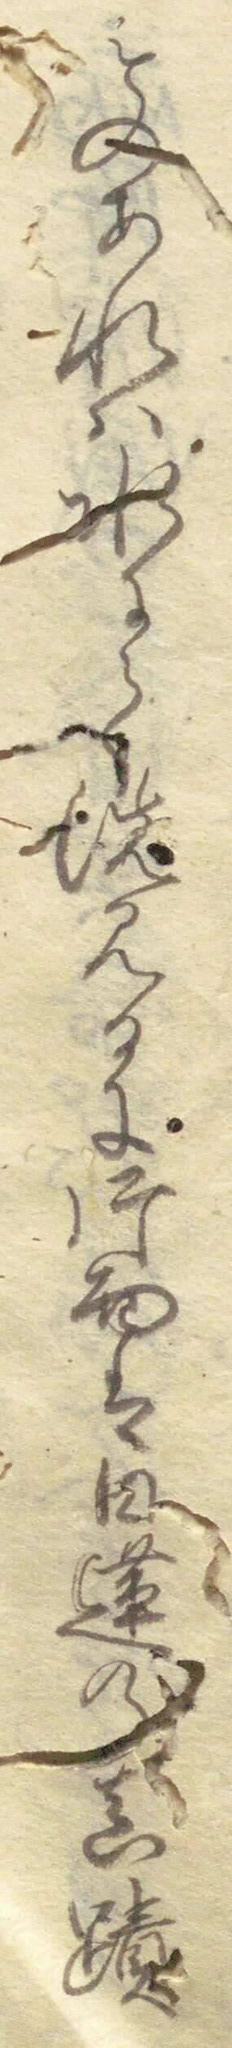ものあれは水にて洗見るに片面は日蓮の真蹟

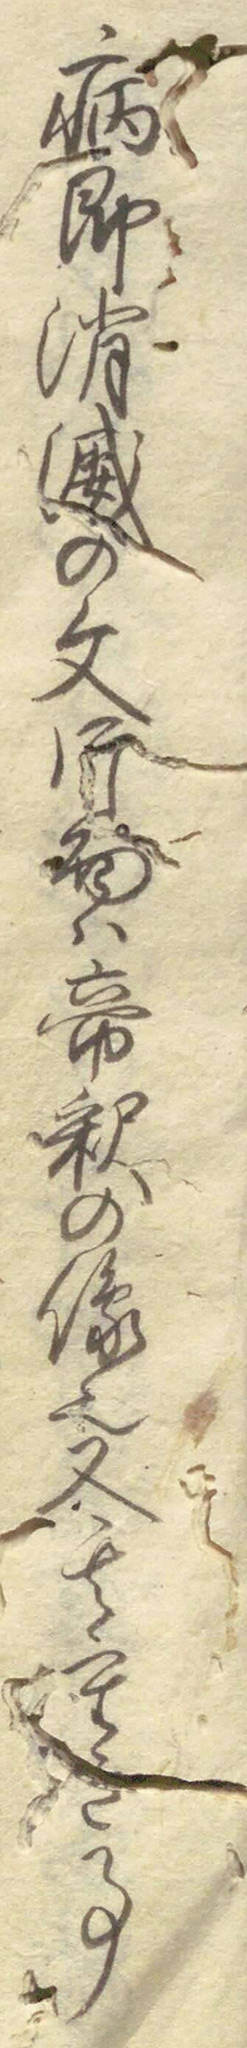病即消滅の文片面は帝釈天の像也又其重き事
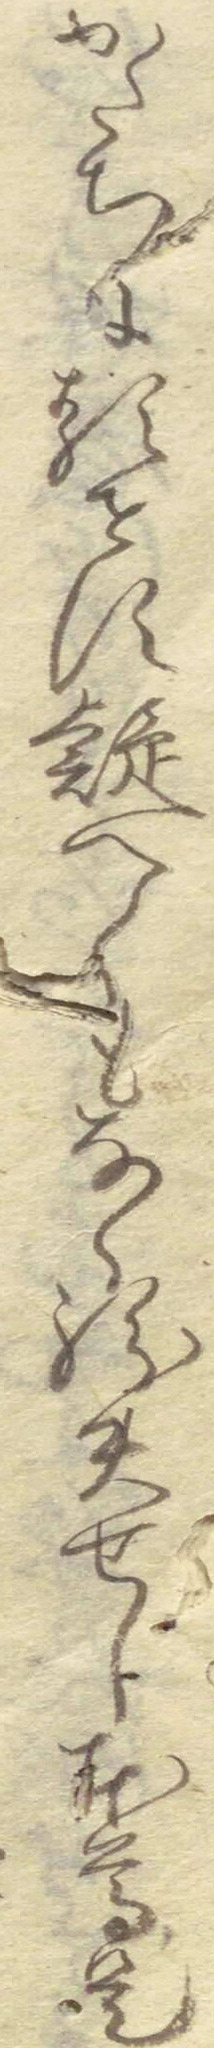かたちに類せす疑へくもなく紛失せし本尊是
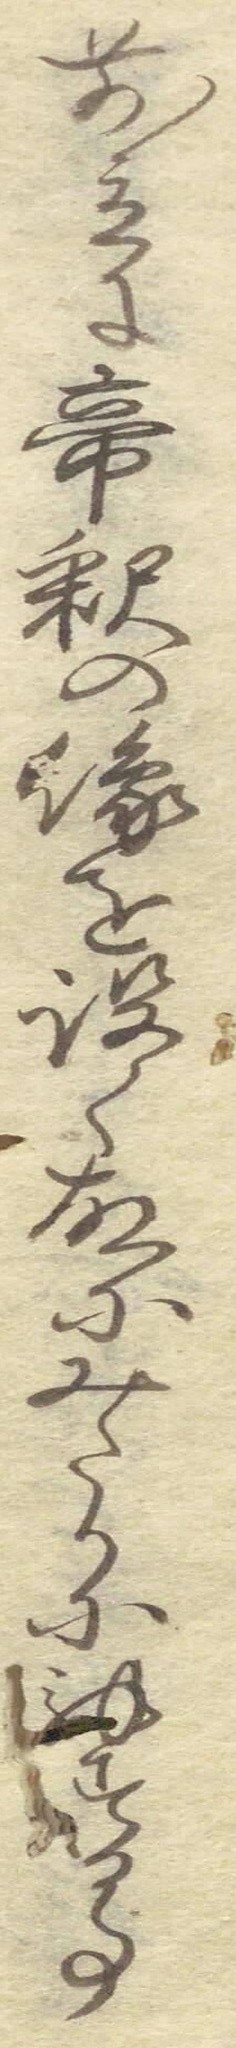前立に帝釈の像を設く故にみたりに拝する事
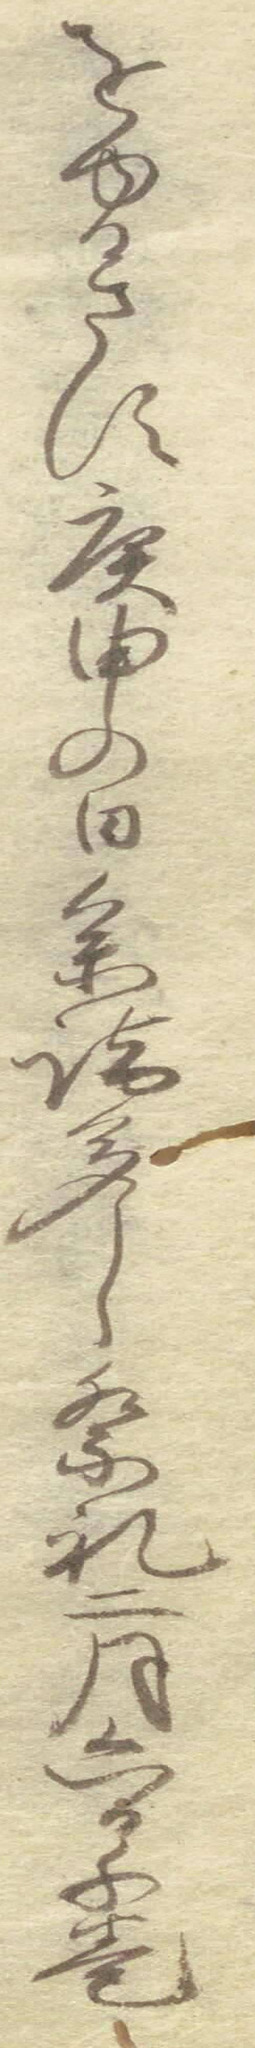をゆるさす庚申の日参詣多し祭礼二月六日千巻
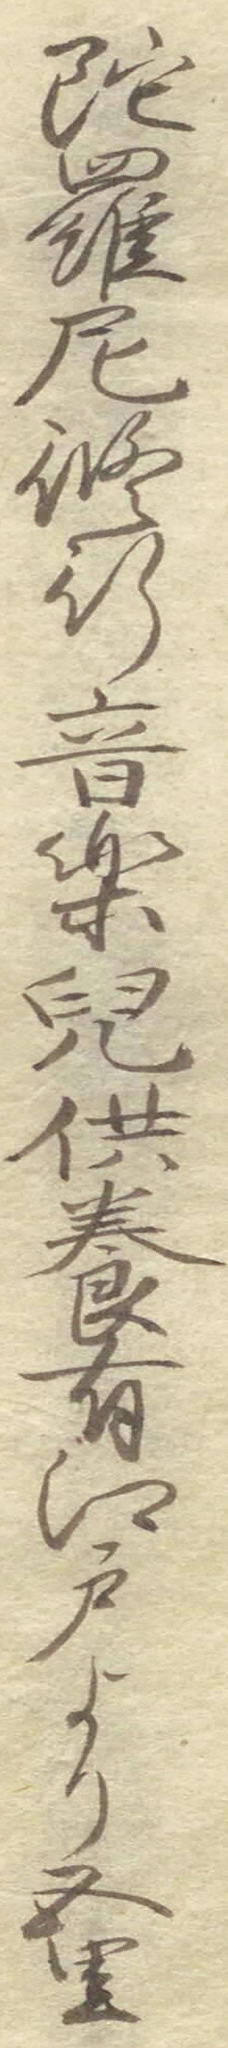陀羅尼修行音楽児供養有江戸より五里
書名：四神社閣記
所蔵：茨城大学附属図書館 国文学研究資料館
